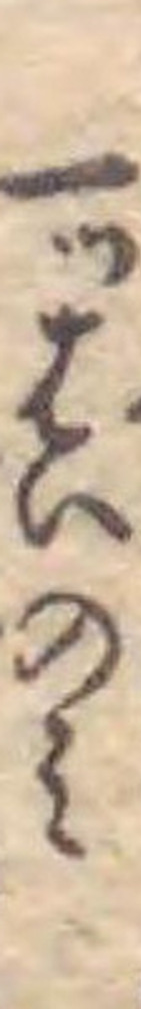一ッはいのみ
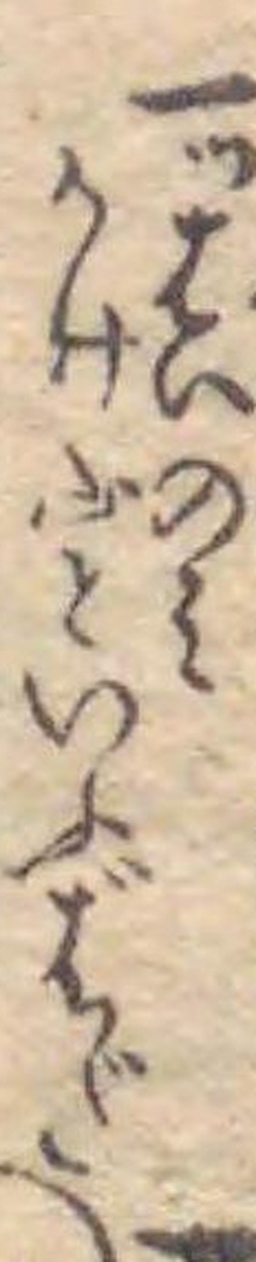かけ山といふばだ

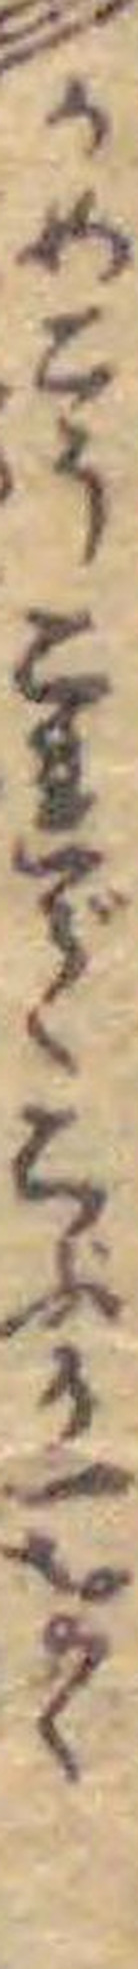うめこうこれでこぶか一をく
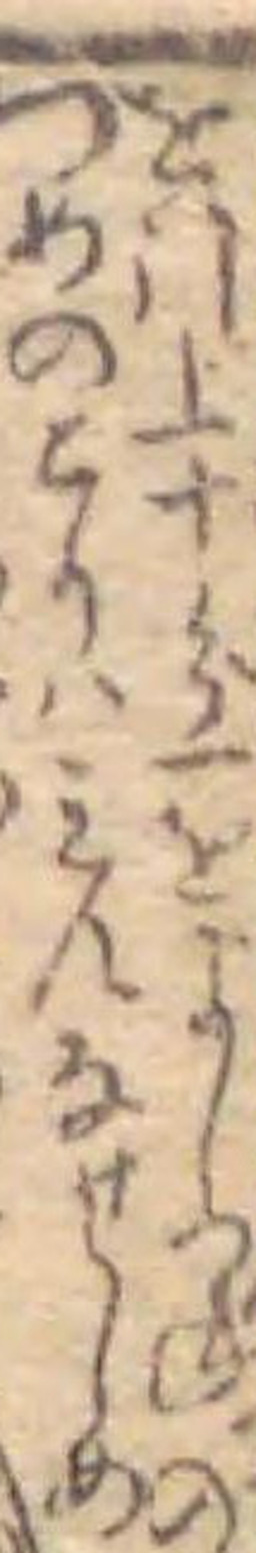つめのこりはみんなせしめ
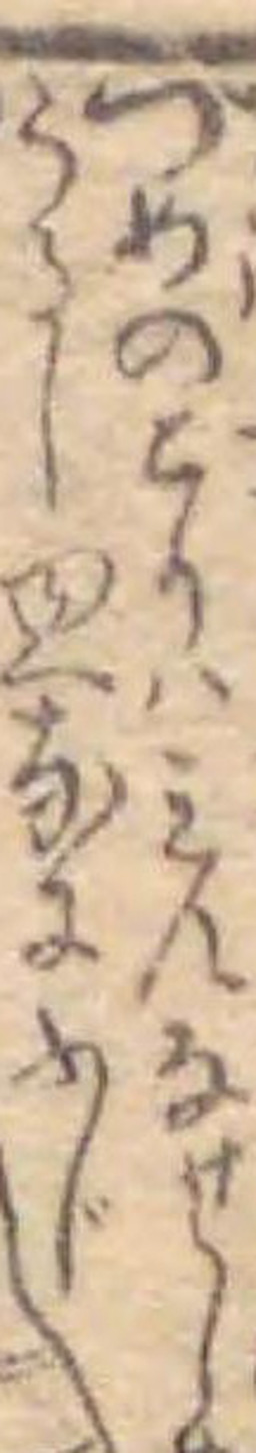うるしゆへなにふじ
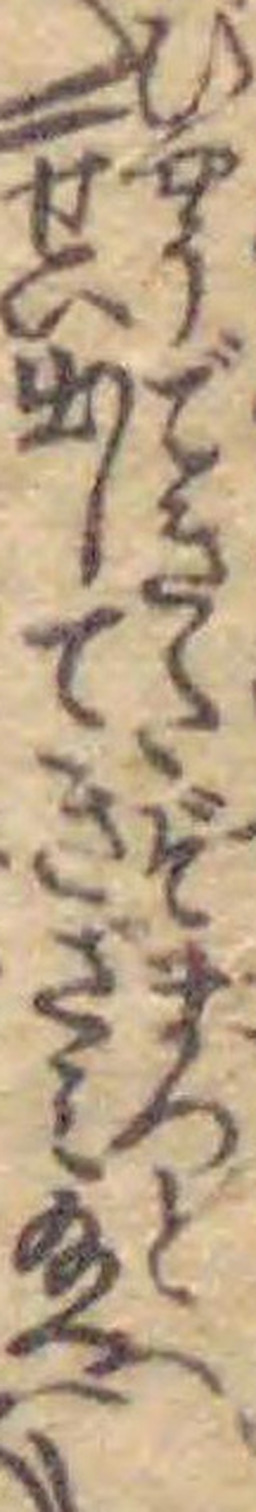せい出してきざみ給へ
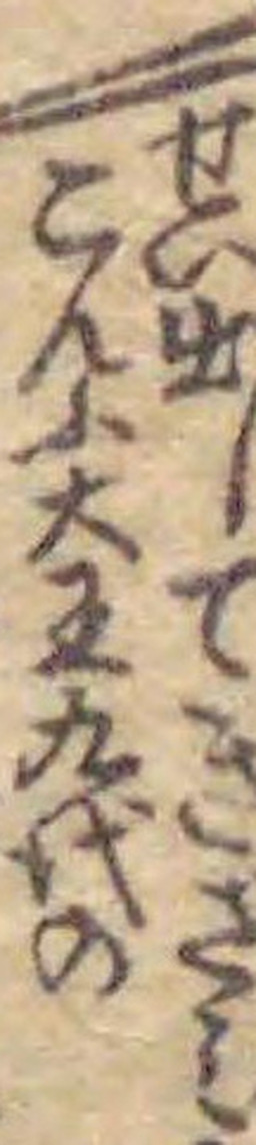こんふ大王九代の
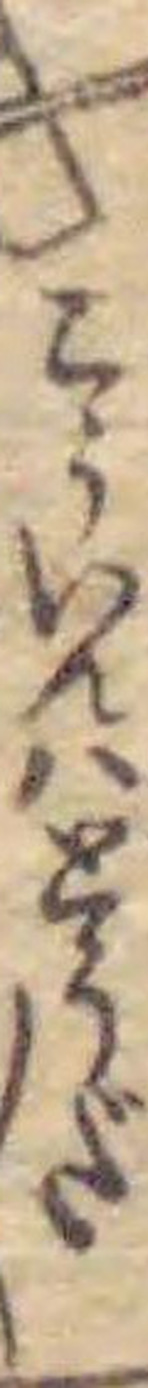こういんはとうだ
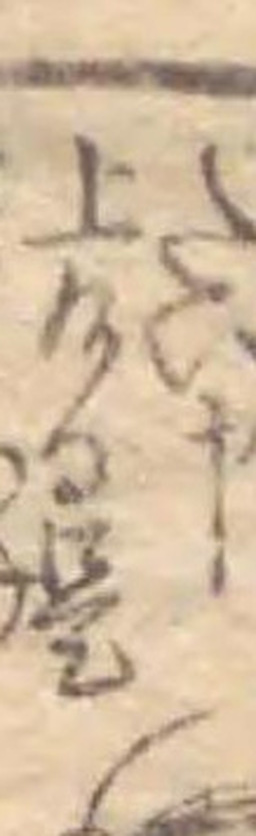上ける是
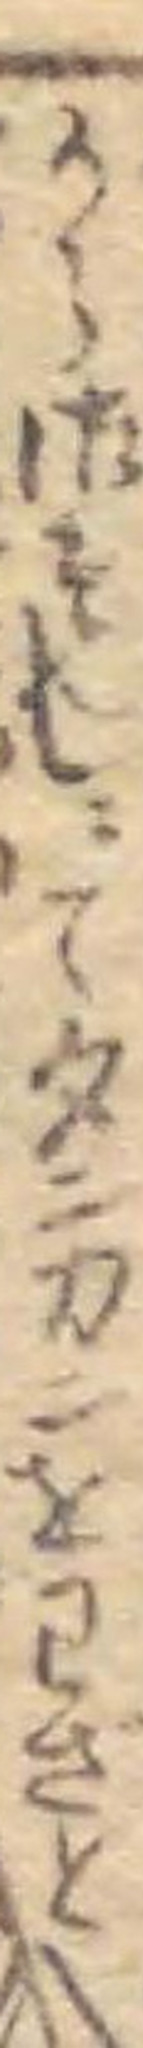から御そんしにてタンカンをわざと
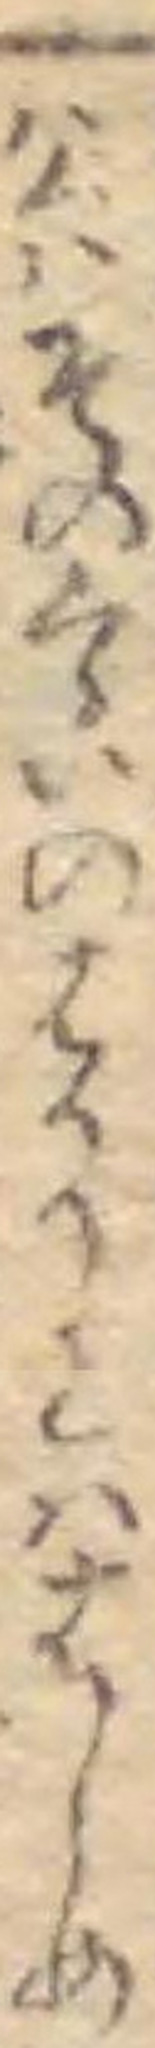公はそのくらいのはかり事ははしめ
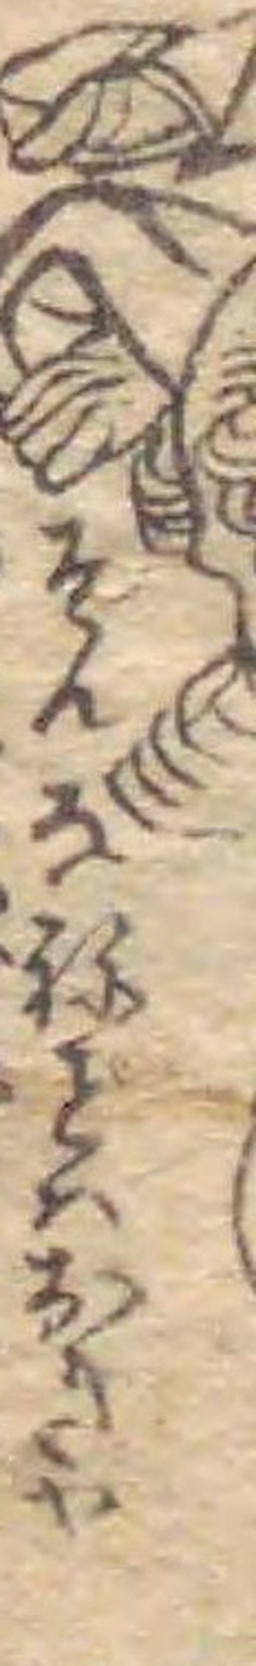そんなねことはおきや
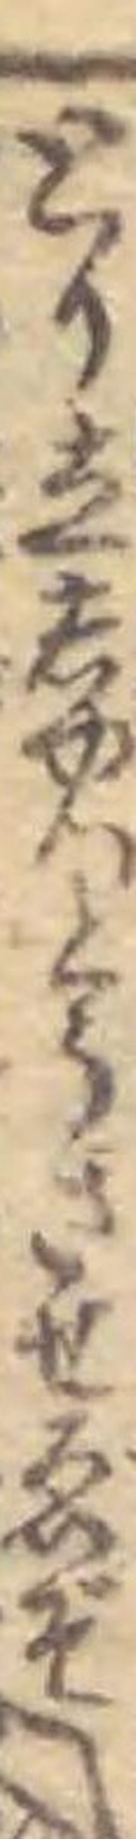とり立しゆつとうさせゑぞ
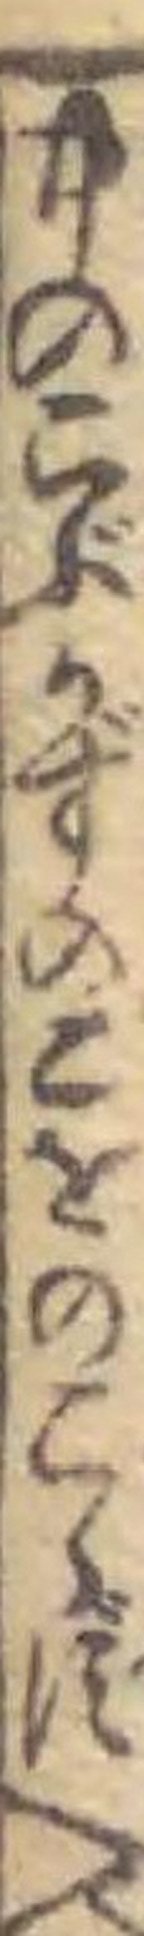中のこぶかずのこをのこらず
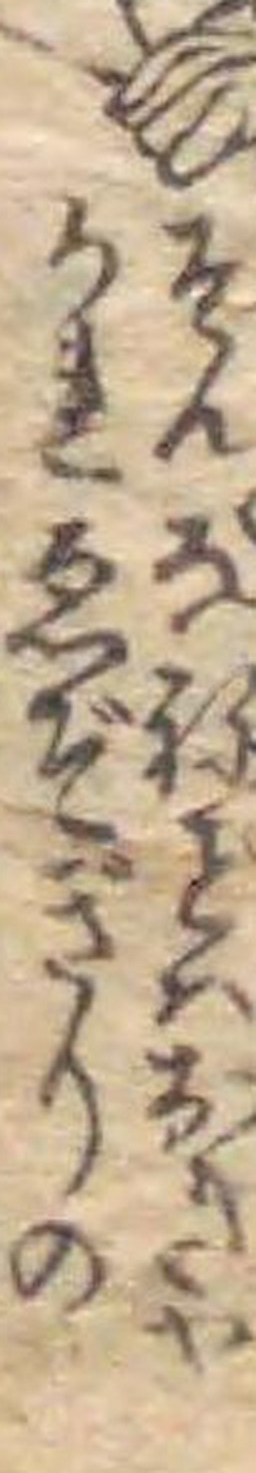かれゑぞぎりの
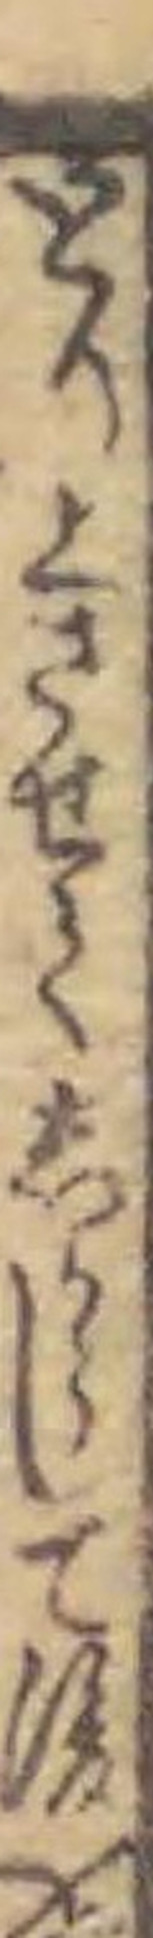とり上させてしかうして後
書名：悦贔負蝦夷押領 : 3巻
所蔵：国立国会図書館 National Diet Library, JAPAN
